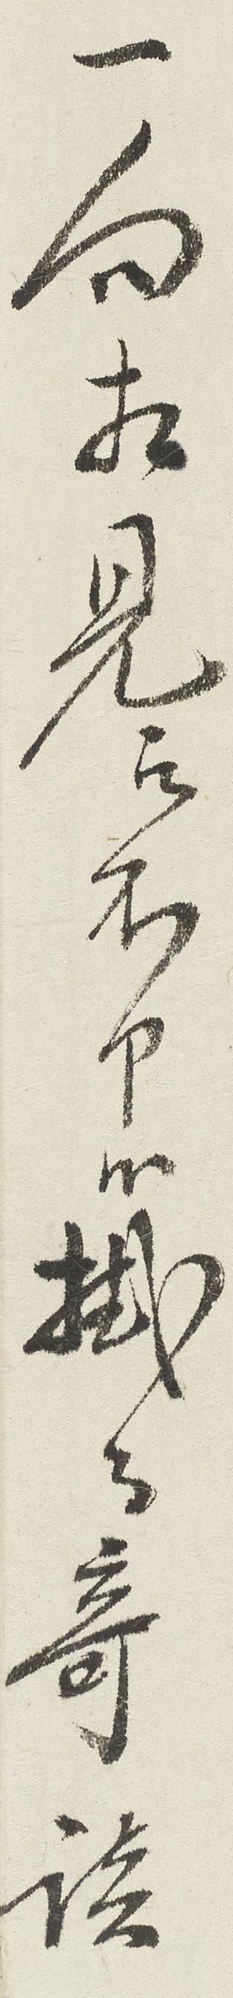一向相見え不申候掛る奇談
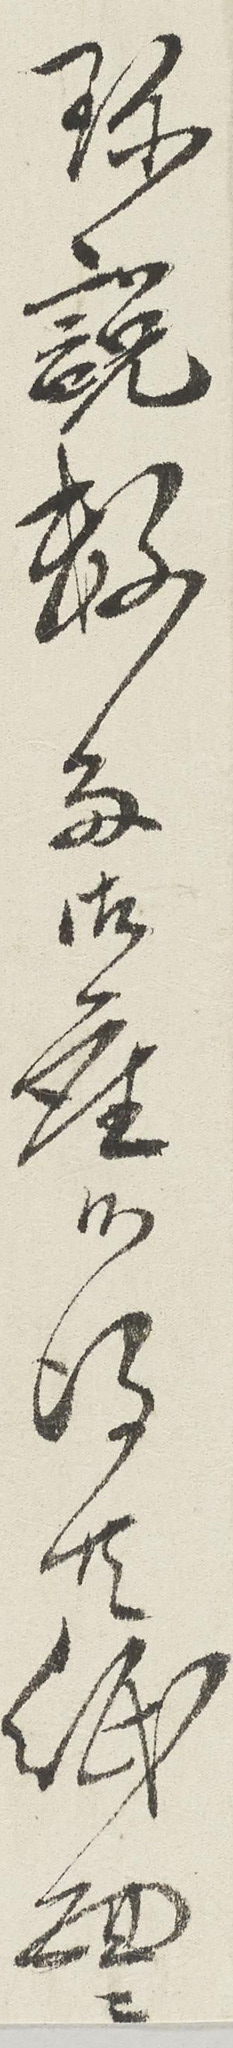珍説数多御座候得共紙面ニ
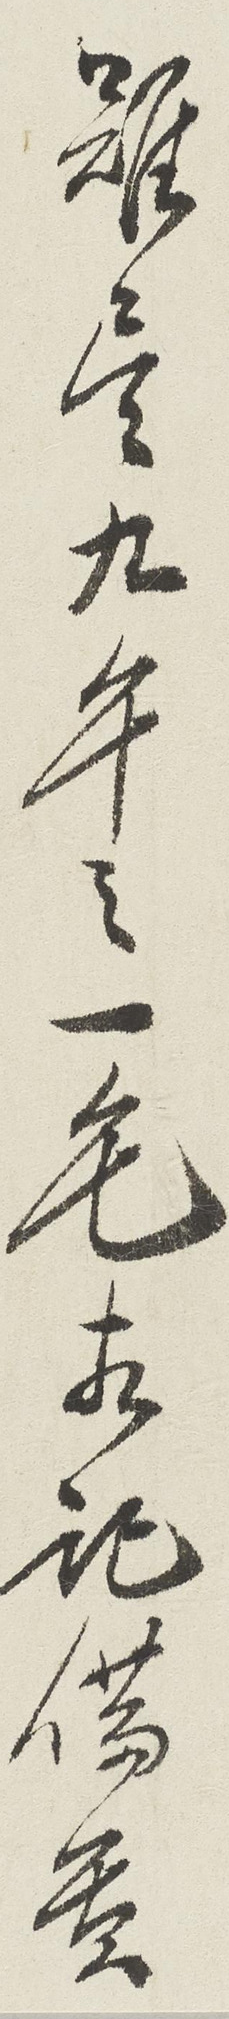難尽九午之一毛相記借貴
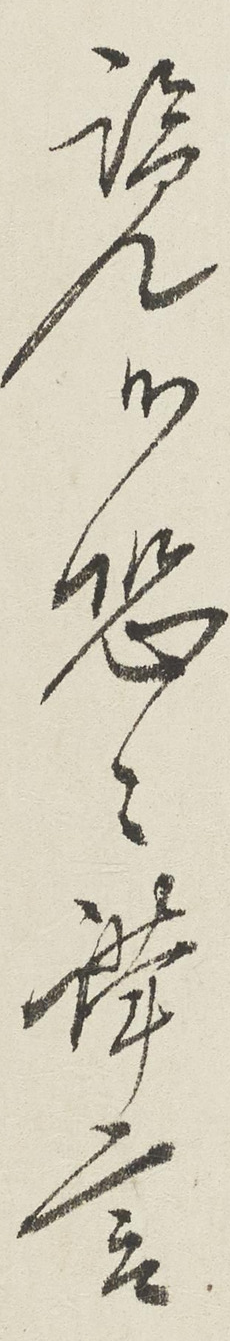覧候恐々謹言
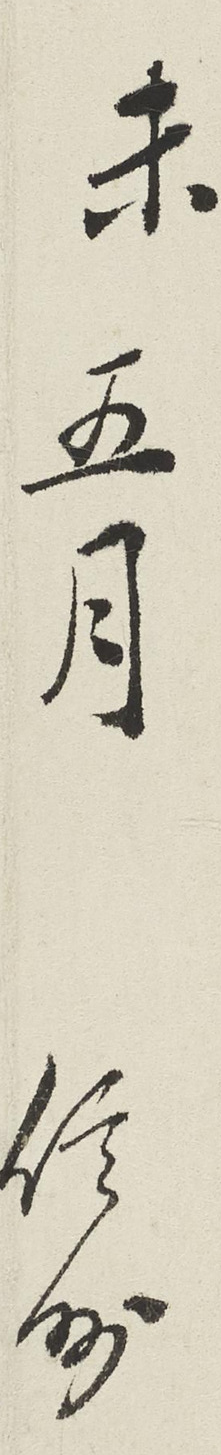未五月信州
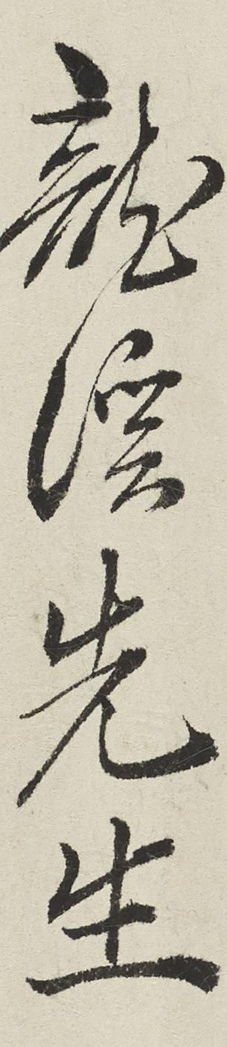龍渓先生
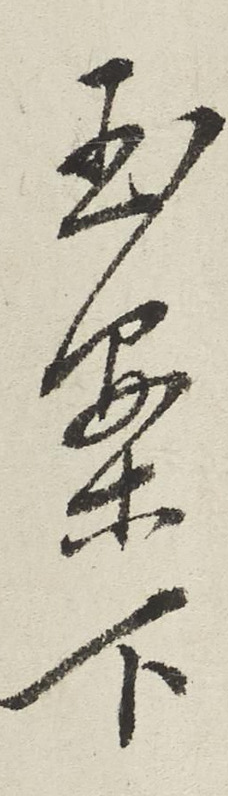玉案下
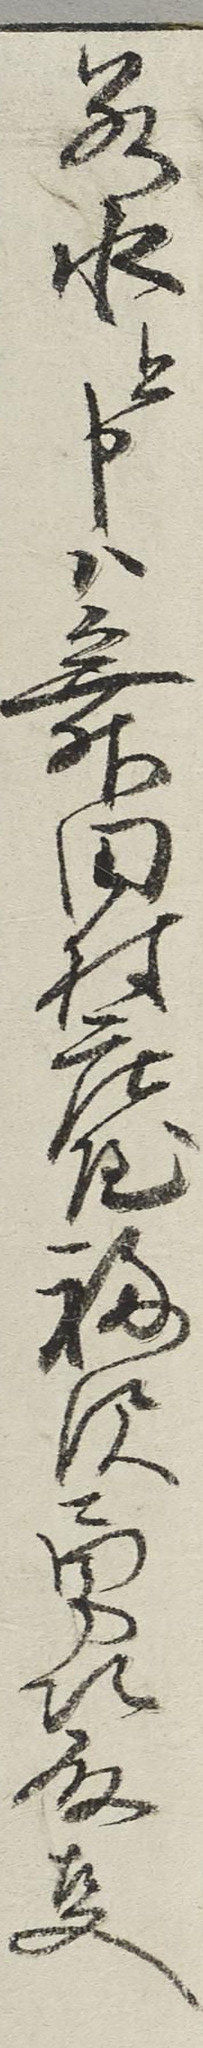若水と申は舞田村庄屋福沢勇次殿事
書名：[善光寺地震に関する書状]
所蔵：東京大学地震研究所図書室 Earthquake Research Institute Library, The University of Tokyo, JAPAN
